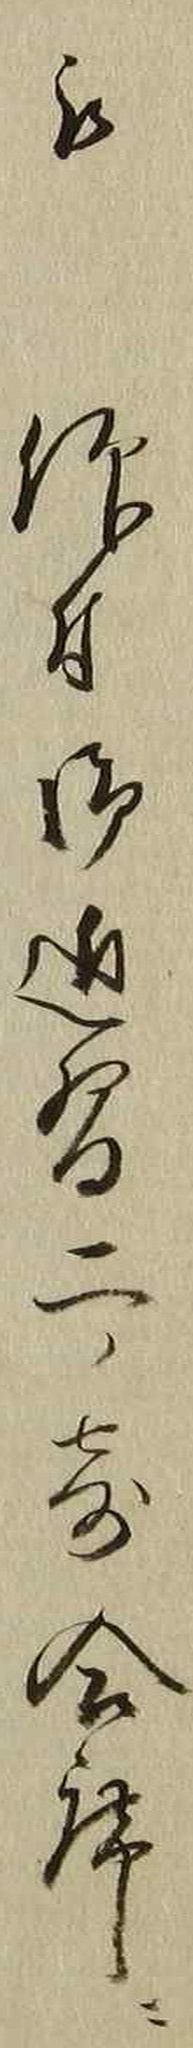被仰付御近習二ノ寄合席
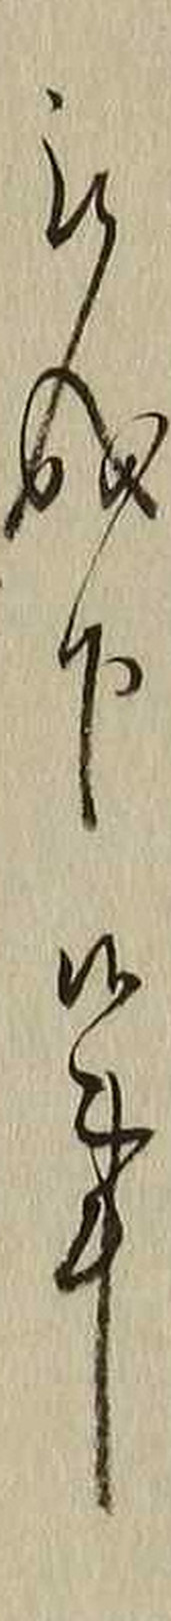被成下候事
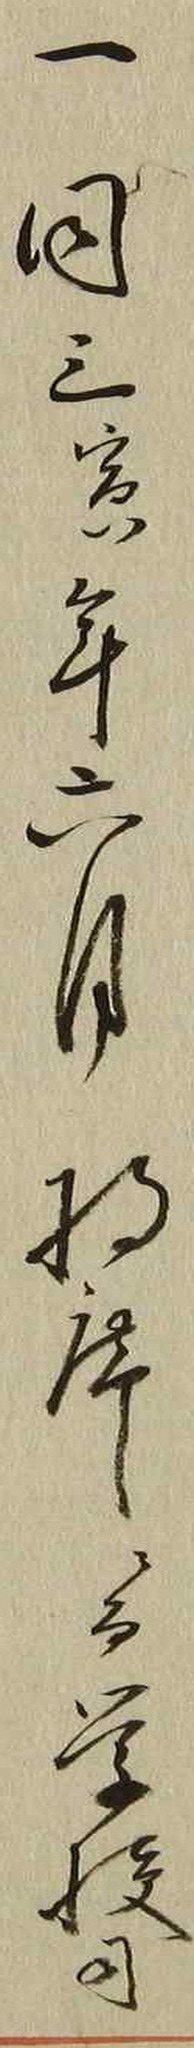一同三寅年六月持席ニ而学校司
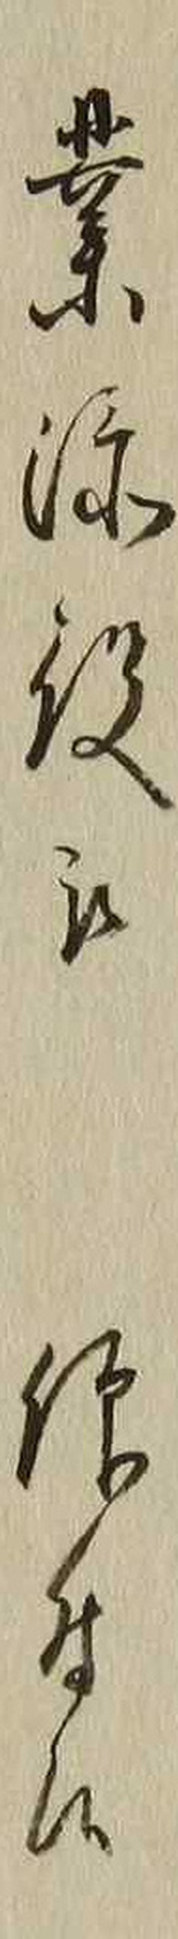業添役被仰付候
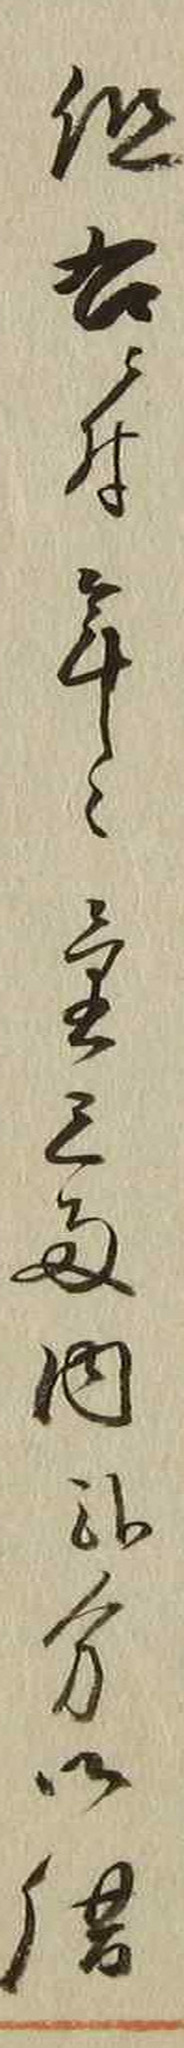但右ニ付年々童三両内弐分御借
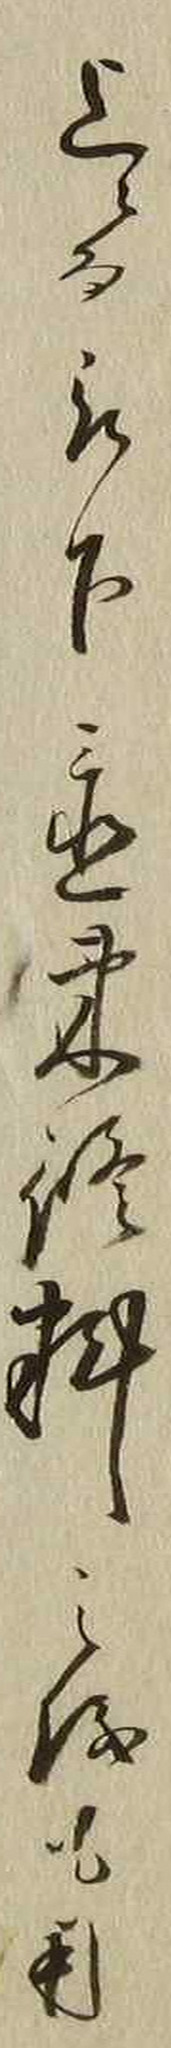上ニ而被下置束修料之儀も用
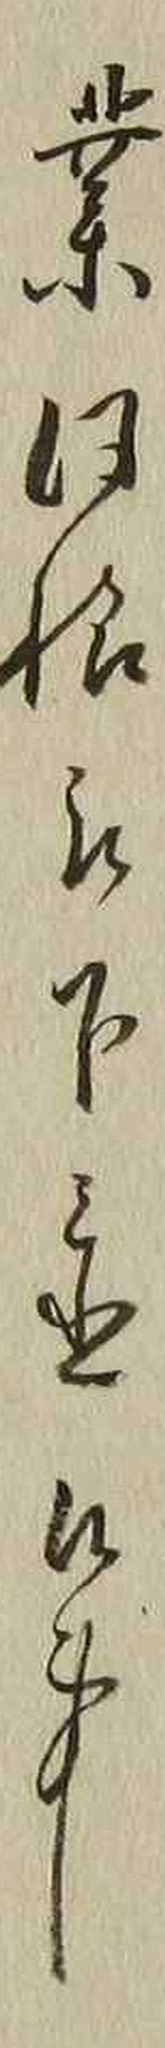業同様被下置候事
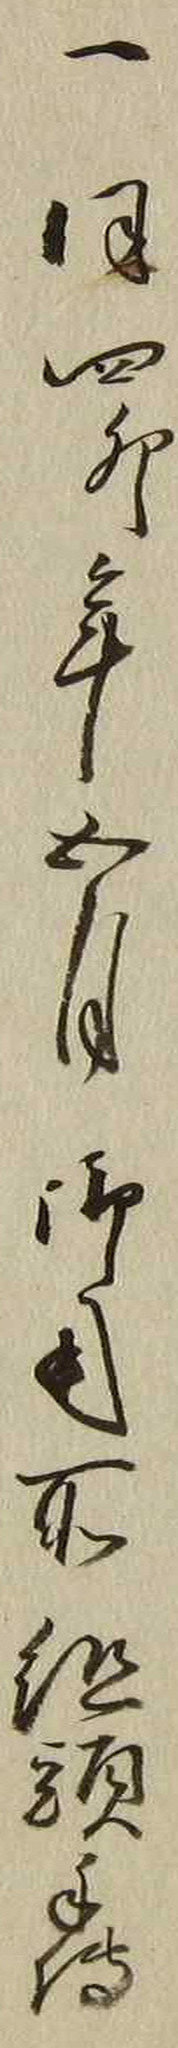一同四卯年五月御用所組頭手伝
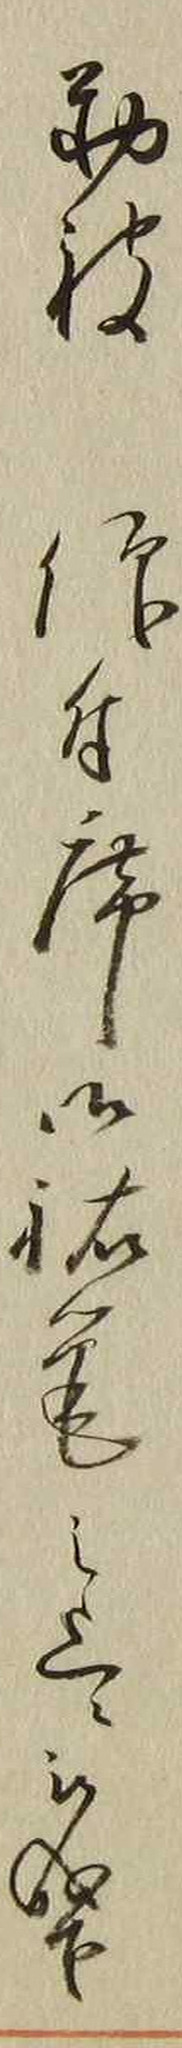勤被仰付席御祐筆之上ニ被成下
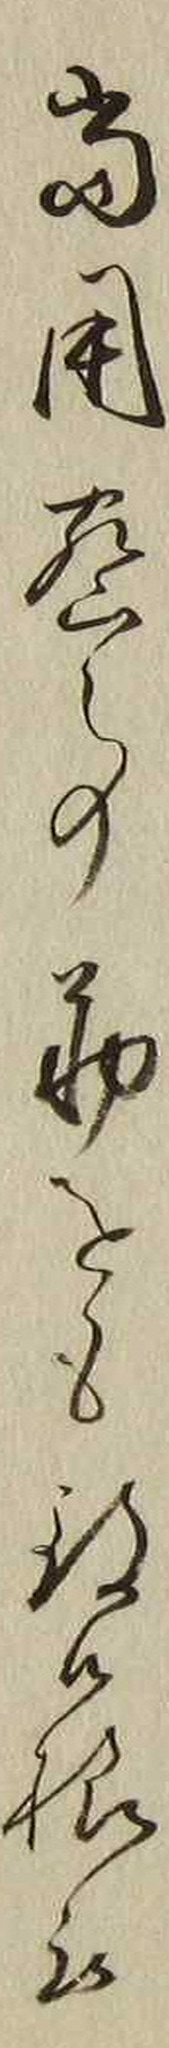当用有事勤をも致候様被
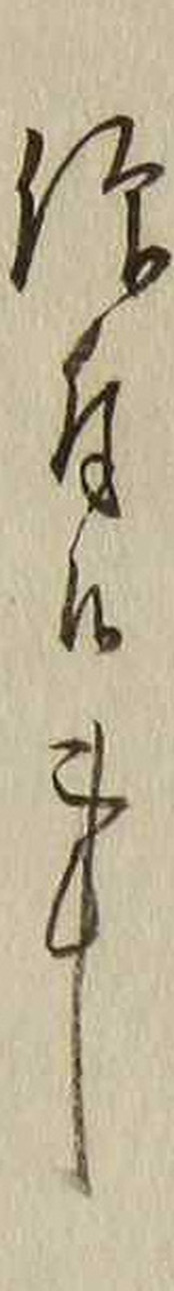仰付候事
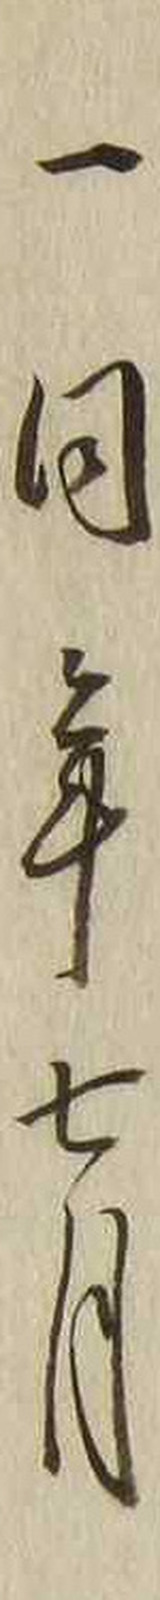一同年七月
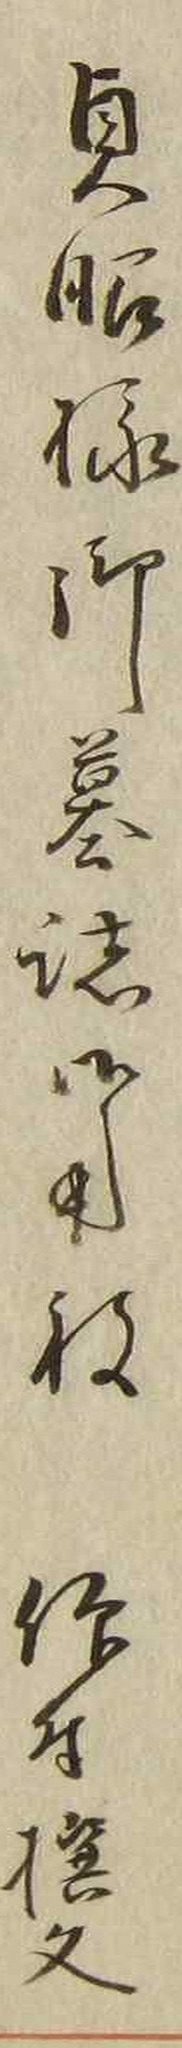貞昭様御墓誌御用被仰付撰文

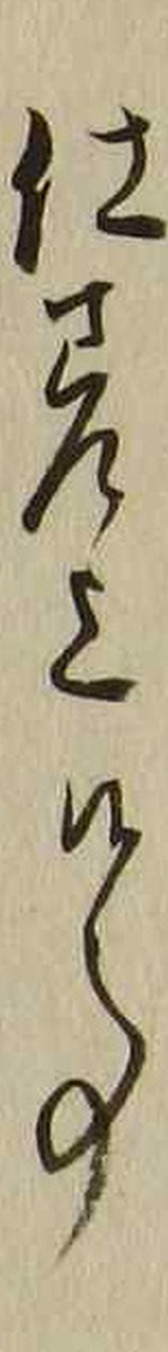仕差上候事
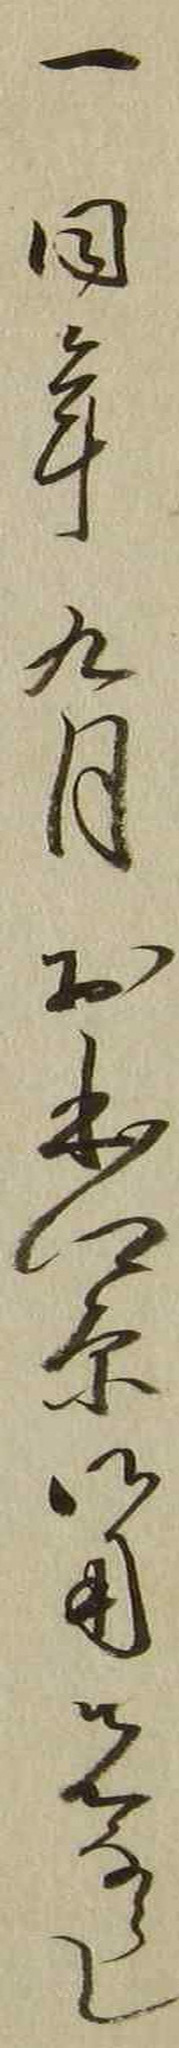一同年九月於本郷原御用先ならし
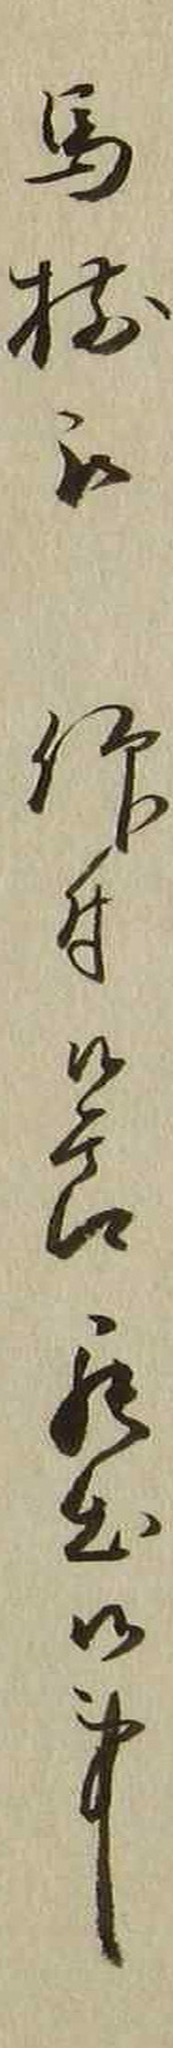馬揃被仰付候節罷出候事
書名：諸士系譜　巻之68　を之部2
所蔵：会津若松市立会津図書館
